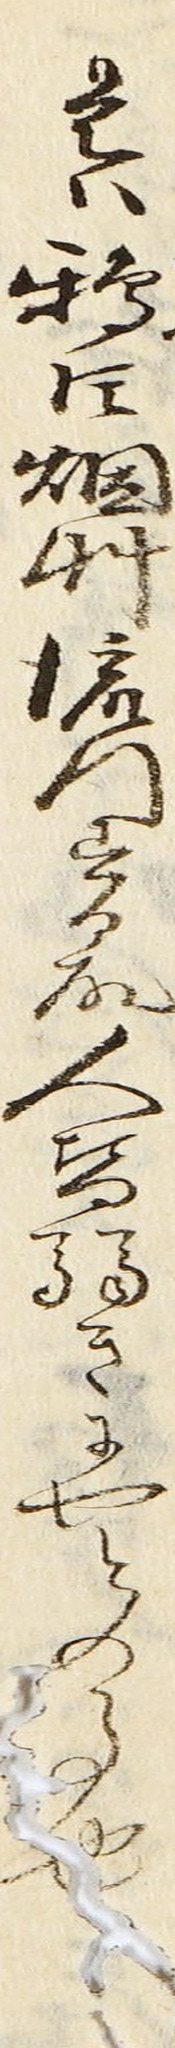是ハ鴉片烟艸流行する故人皆弱きにやとの事也
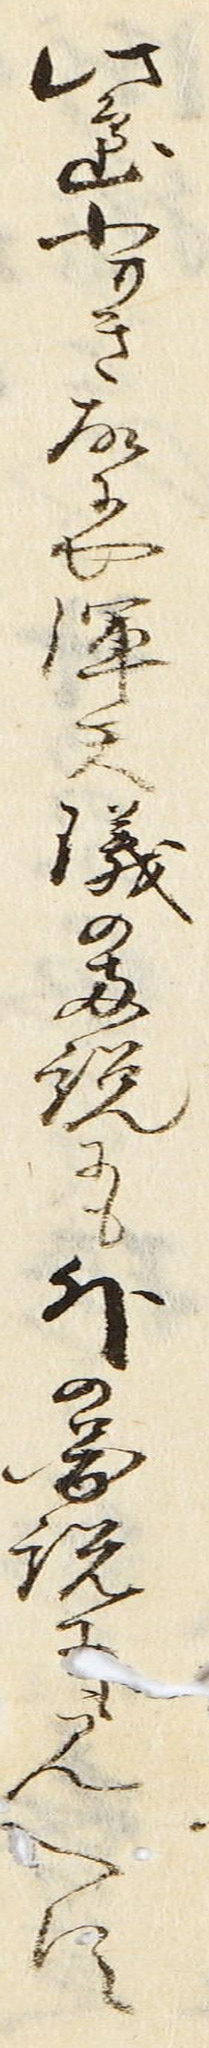此島小サき故にや渾天儀の両説にも外の図説にも見へす
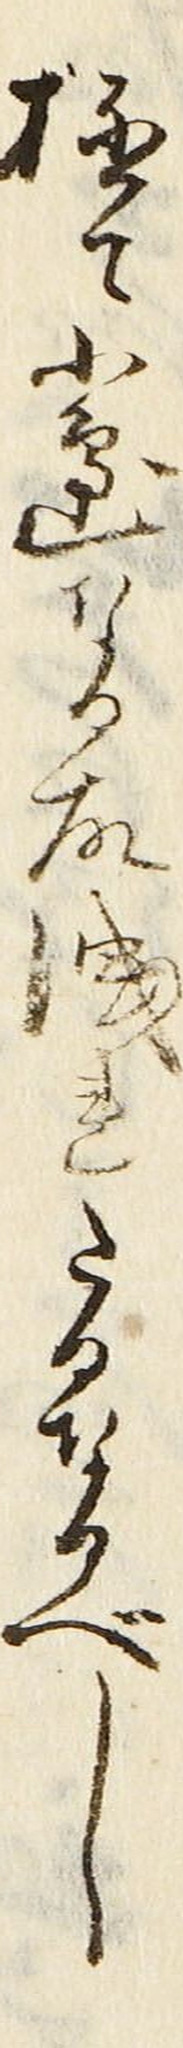極て小島なる故洩れたるなるべし
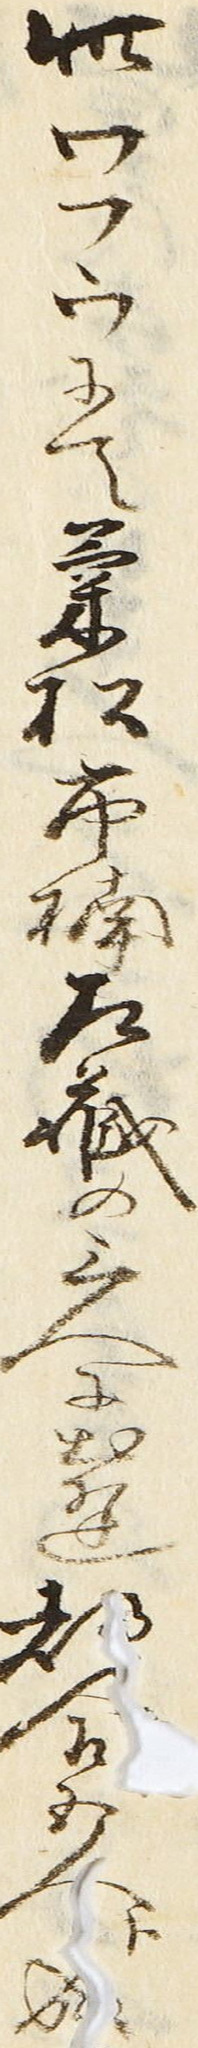此ワフウにて菊松市楠左蔵の三人に出逢都合五人ト成ル
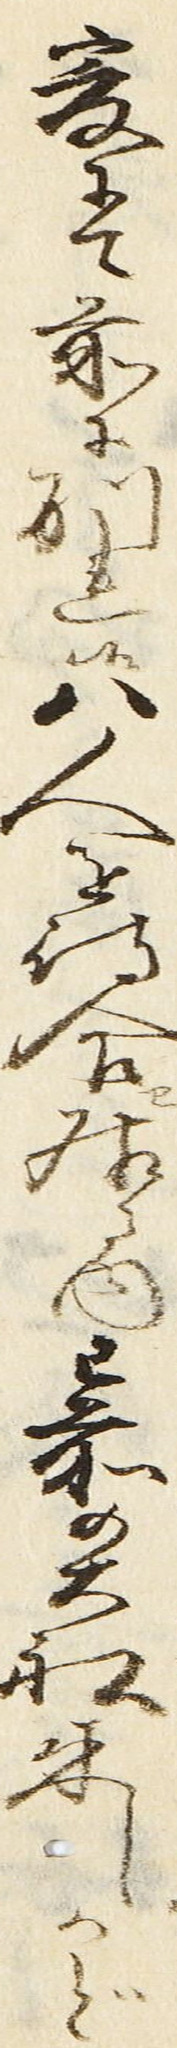爰にて前に別れ候八人を待合セ居候内已前の大船来しかど
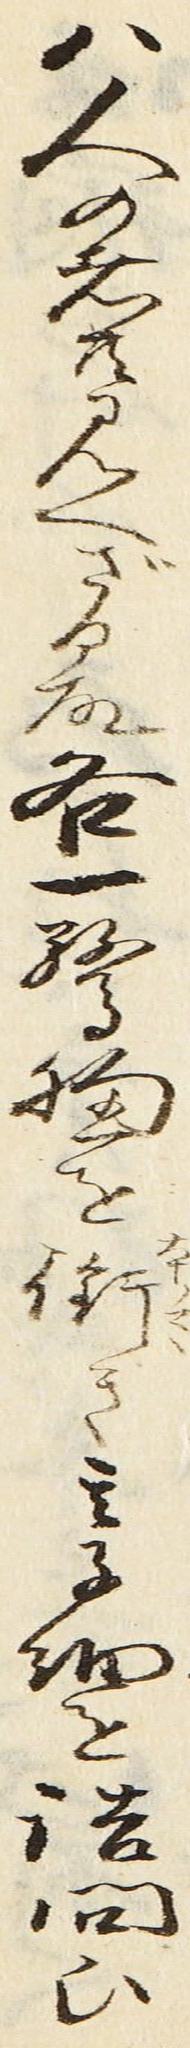八人の者共見へざる故各一驚胸を衝き其子細を詰問ひ
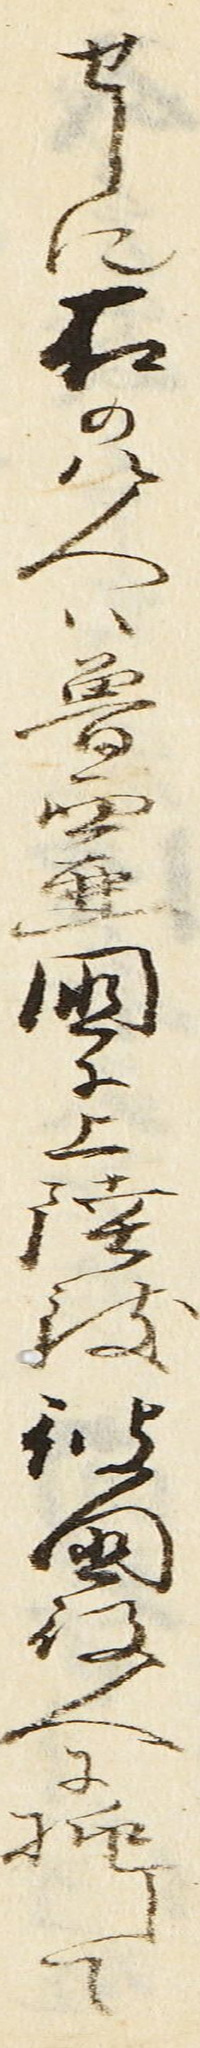せしに右の八人ハ魯西亜国に上陸致彼国役人に挑して
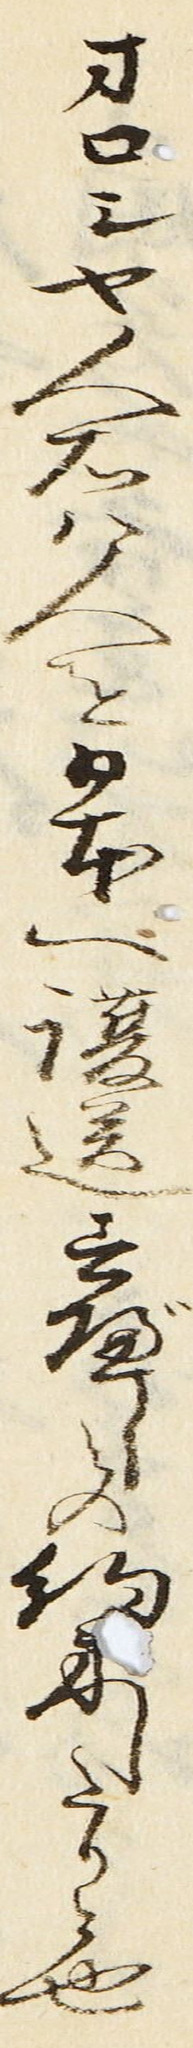オロシヤ人右八人を日本へ護送すべしとの約束したりと也
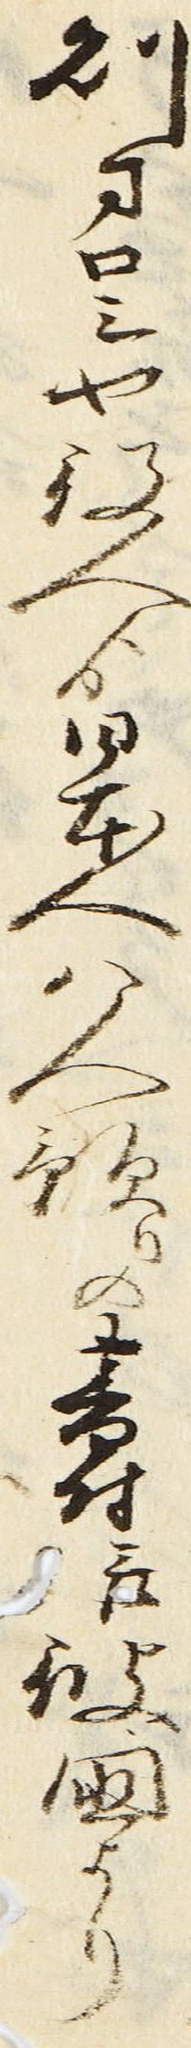則オロシヤ役人ゟ日本人八人預りの書付并彼国より
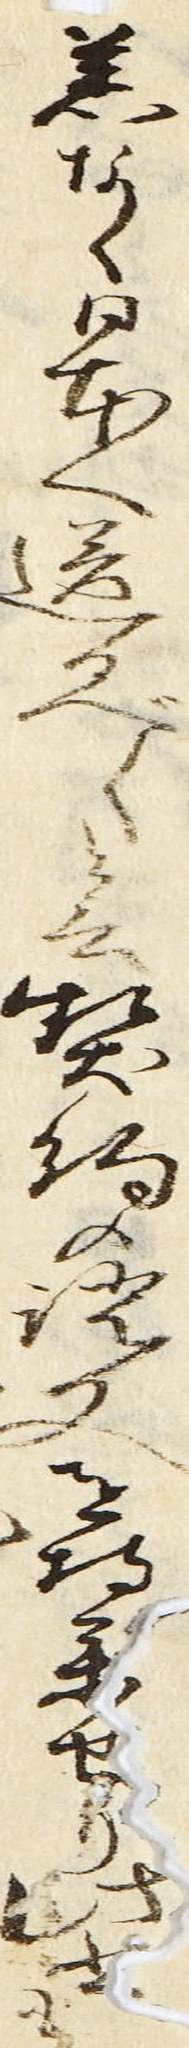恙なく日本へ送るべしと言契約の証文を持参せり此も
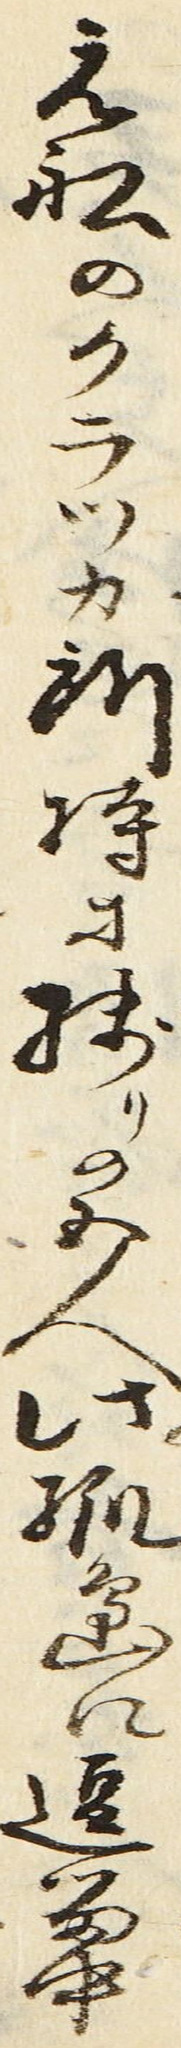元船のクラツカ所持す残りの五人此孤島に逗留中
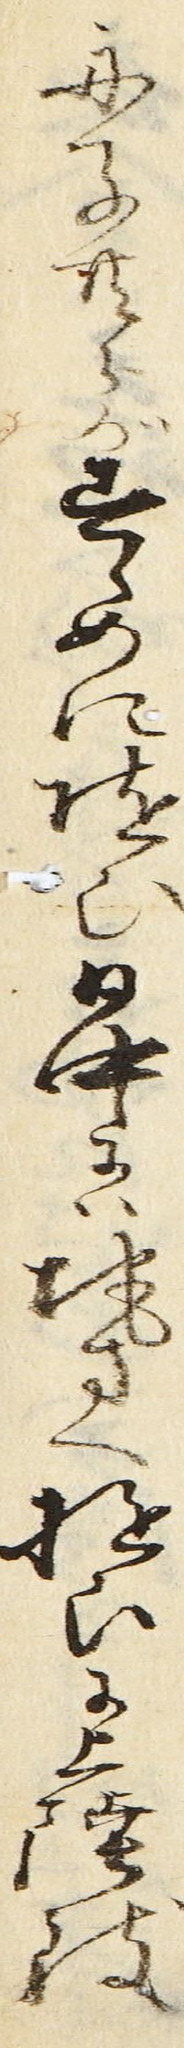舟子共らがすゝめに随ひ日中にハ地方へ遊ひに上陸致

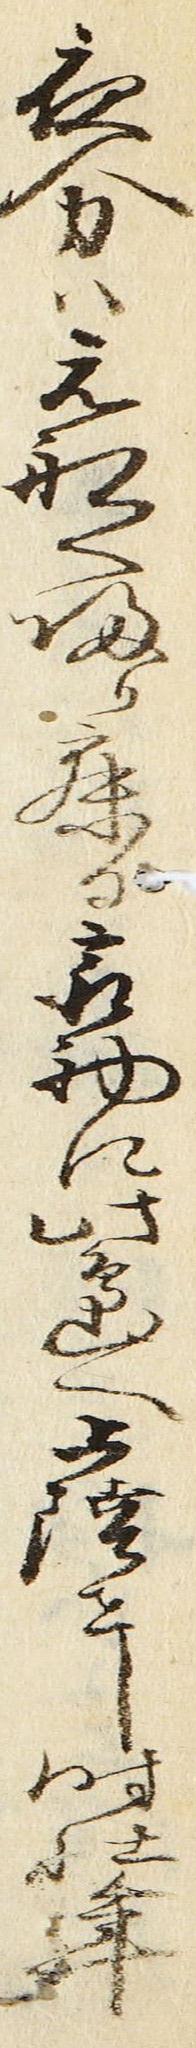夜分ハ元船へ帰り寝る最初に此島へ上陸せし時壮年
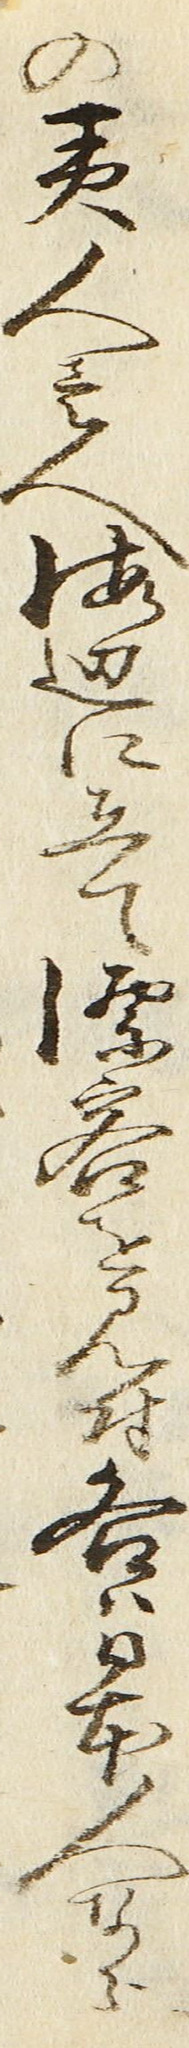の夷人壱人海辺に在て漂客を見付各ハ日本人なら
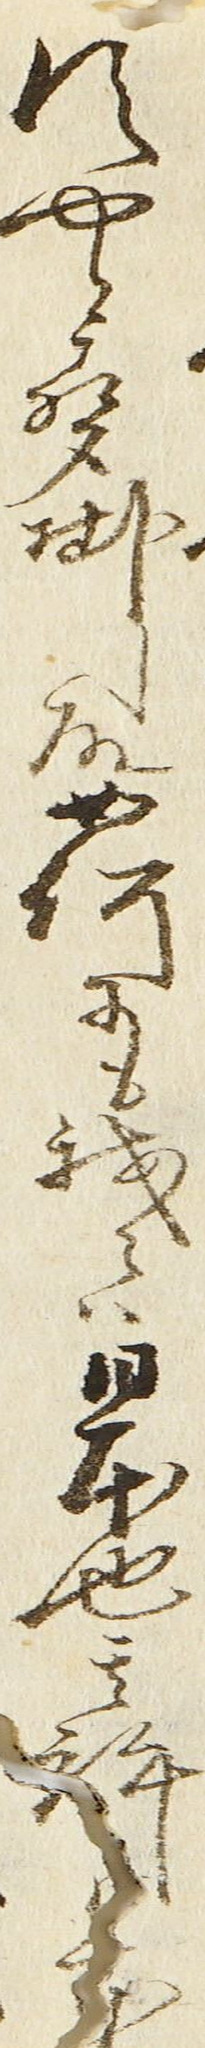すやと声掛し故如何にも我々ハ日本也其許日本語を
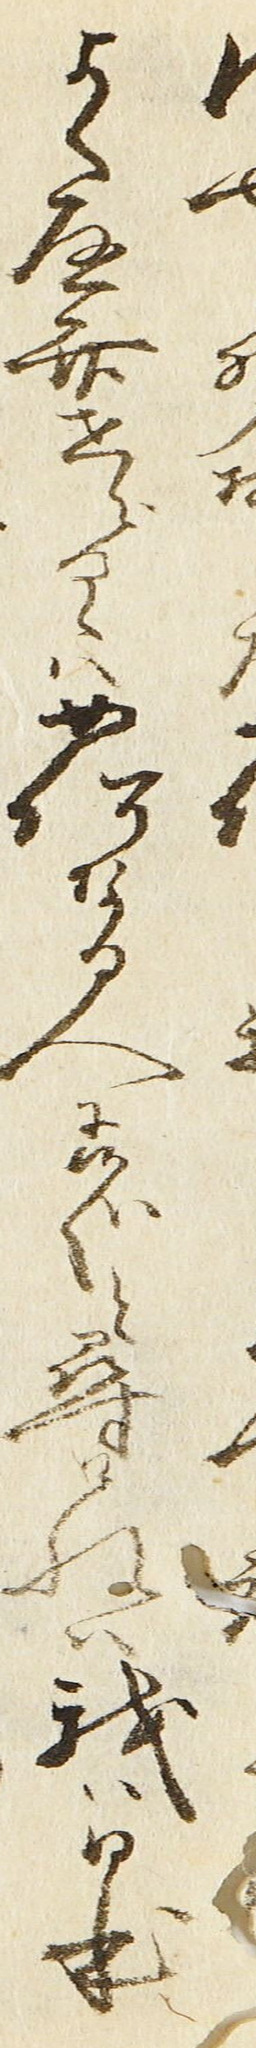よく通弁せらるゝハ如何なる人に候哉と尋けれハ我ハ日本
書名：亜墨利加漂流記聞
